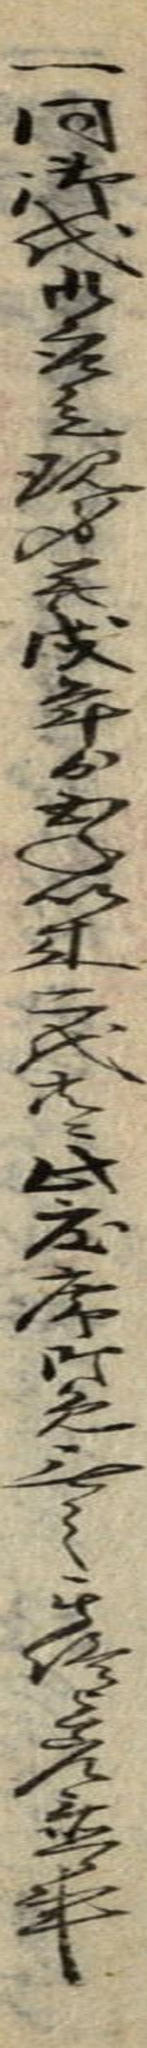一同御代御取立現身并戌年ゟ五年以来二代共に此度席御免無之其侭被差置候事
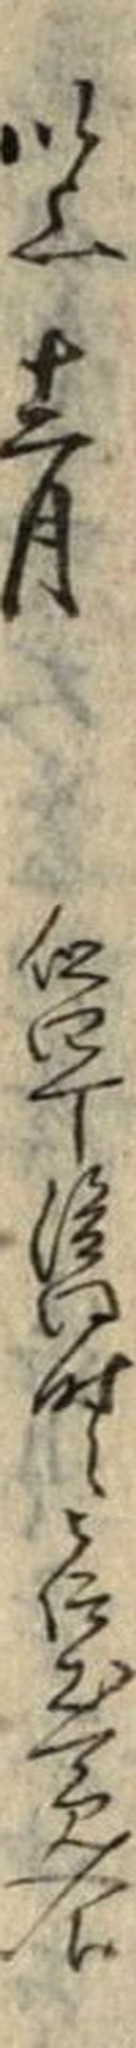以上十二月但四丁後同時之被仰出可見合
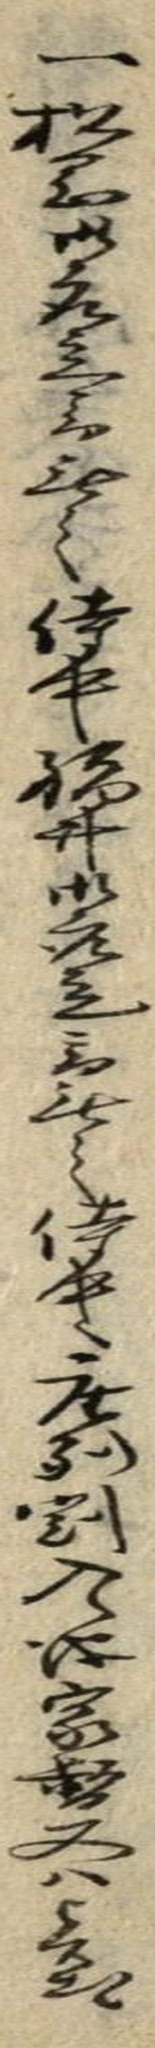一松岡御取立に而無之侍中福井御取立二而無之侍中之座列割入候儀家督又は被召出候
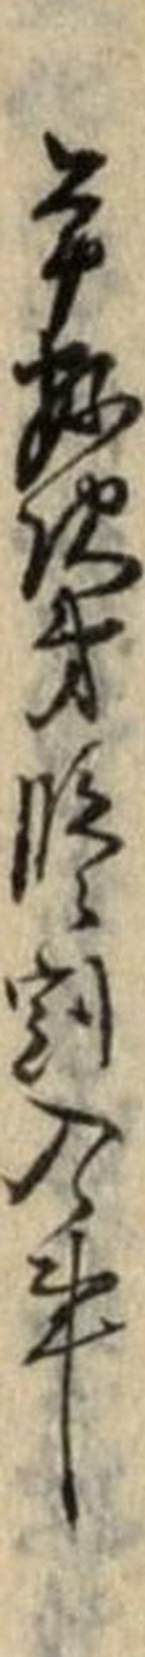年数次第段々割入候事
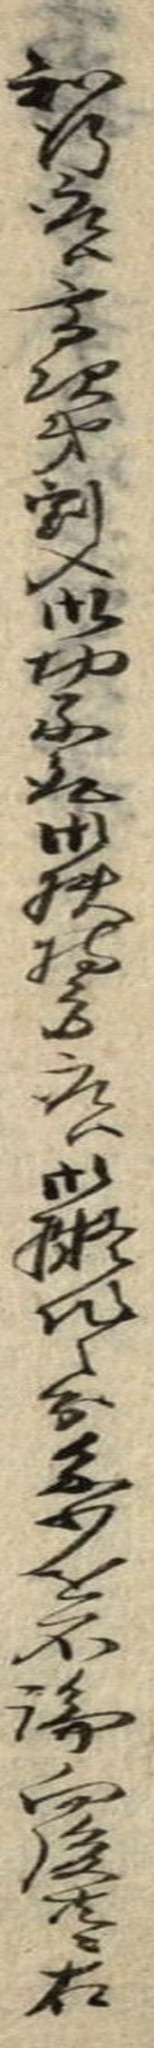知行取は高次第割入御切米取御扶持方取は御擬作之分多少を不論向後共に右
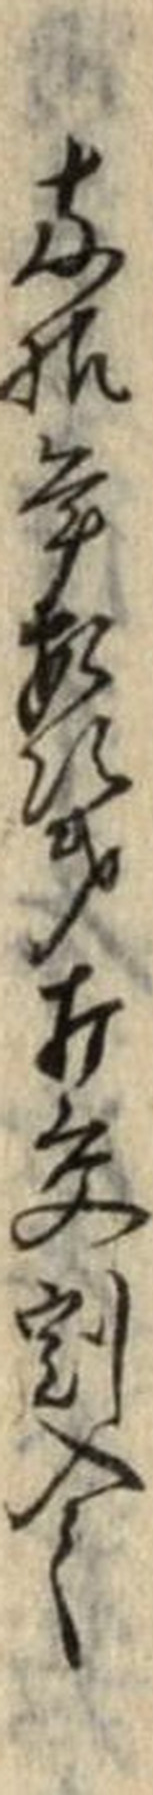両様年数次第打交割入之
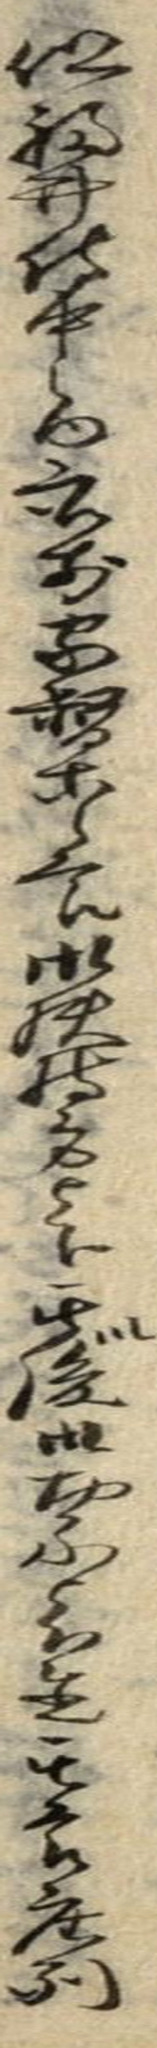但福井侍中之内最前家督等之節御扶持方被下其以後御切米被下置其せつ節座列
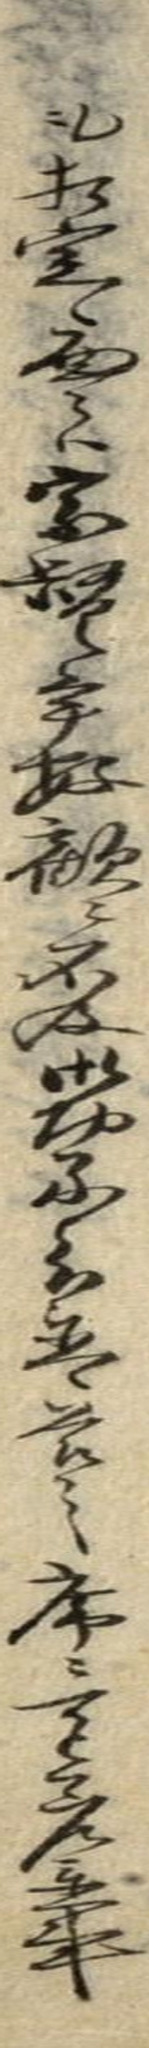も相定候面々は家督之年数顧に不及御切米被下置候節之席に可被差置候事
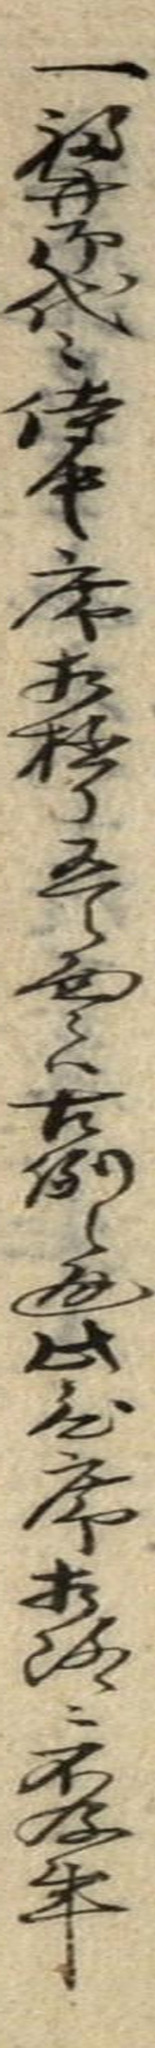一福井御代々侍中席相極り有候面々は古例之通此度席相改候に不及事
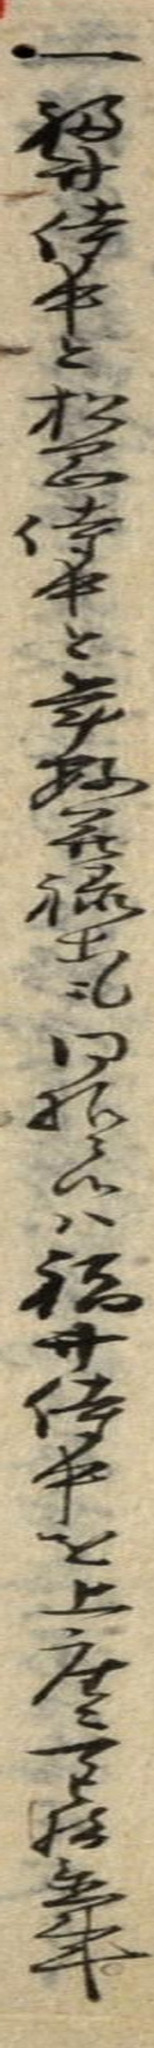一福井侍中と松岡侍中と年数并禄等も同様に候は福井侍中を上席に可被指置候事

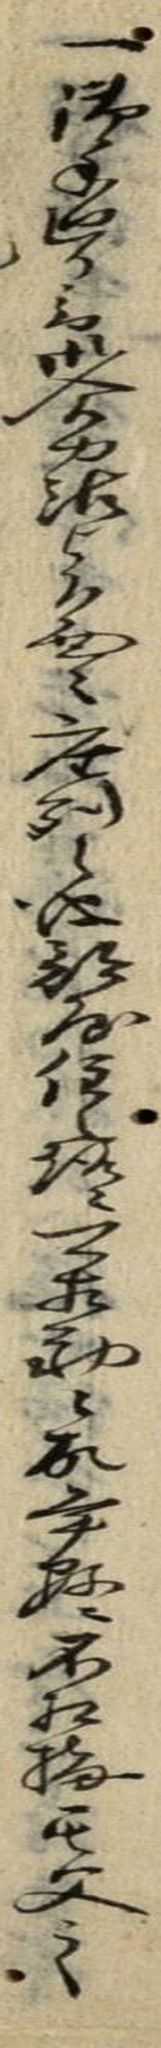一御手廻りに而御合力銀被下候面々座列之儀部屋住候趣に可相勤候故年数に不相拘其父之
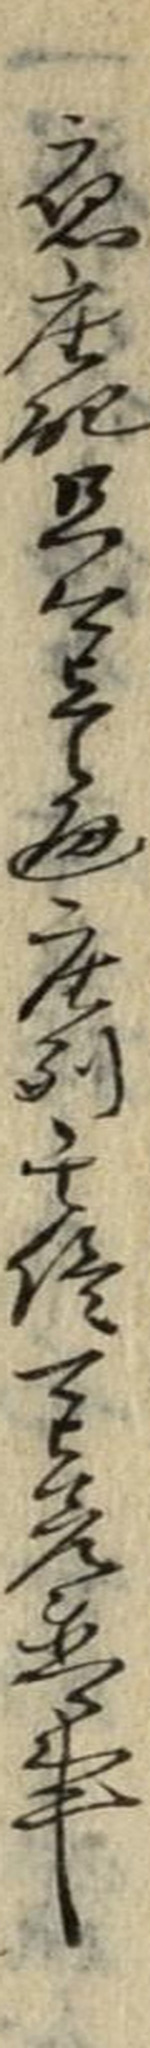応座配只今迄之通座列其侭可被差置候事
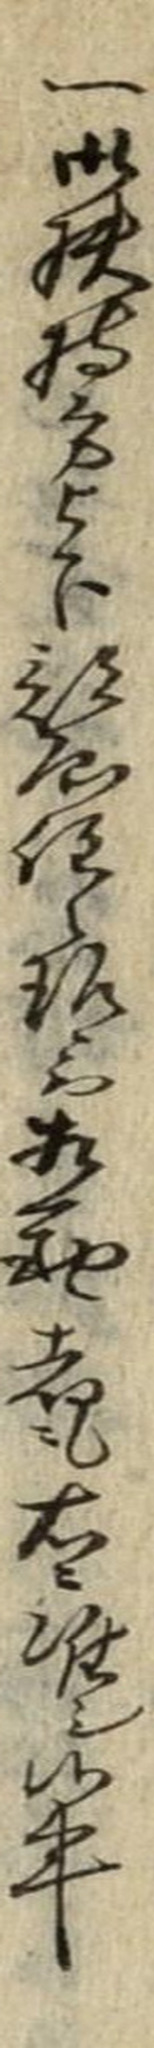一御扶持方被下部屋住趣に而相勤候者も右に准し候事
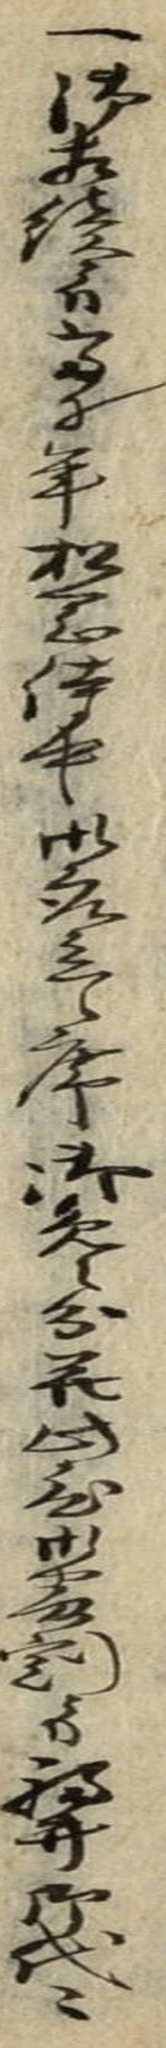一御相続に付当寅年松岡侍中御取立候席御免之分并此度御番割に付福井御代々
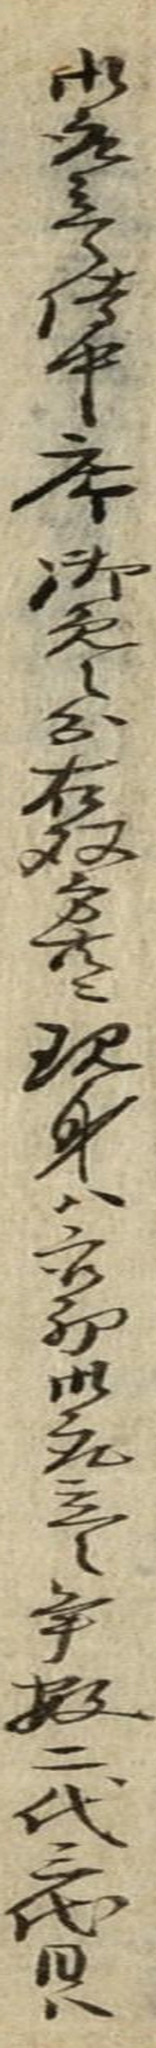御取立之侍中席御免之分右双方方共に現身は最初御取立之年数二代三代目は
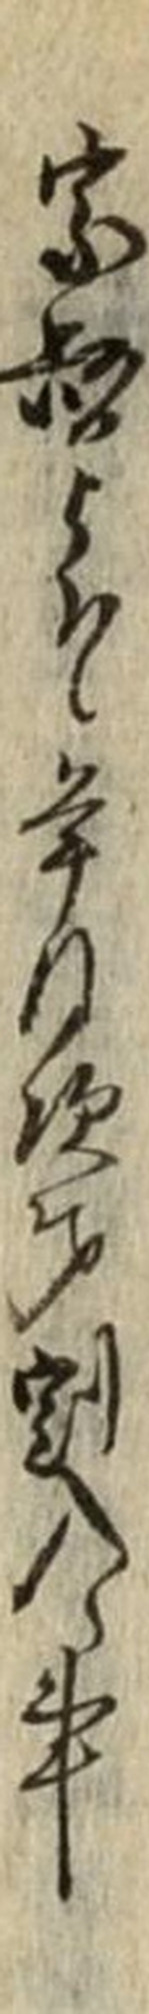家督被下候年月次第割入候事
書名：御用并被仰出之部
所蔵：福井県文書館 Fukui Prefectural Archives
